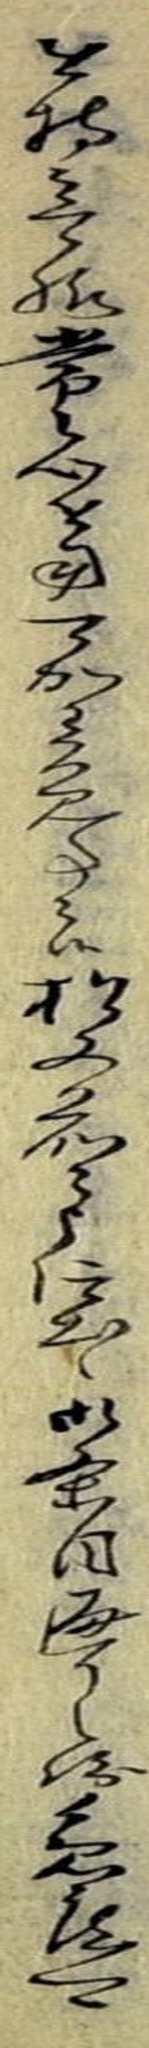を持立候様常々心を用可加異見事ニ候猶又前々被仰出候御条目通り之儀急度可
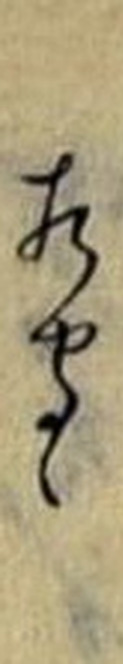相守候
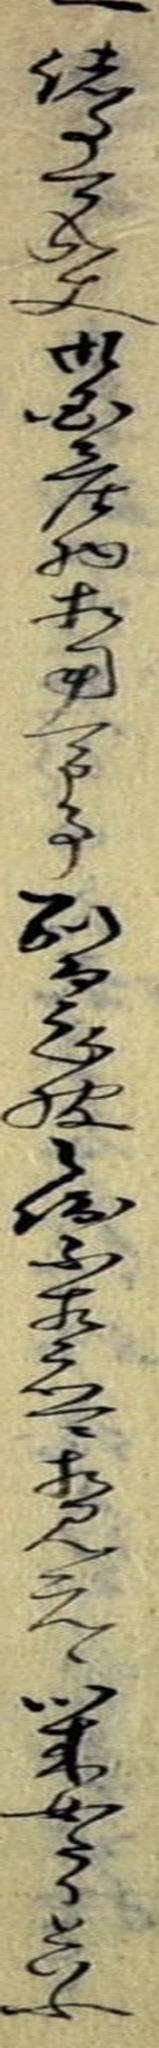一諸事可成丈御国産物相用可申事別而衣服之儀不相応ニ相見え候以来女たりといふ
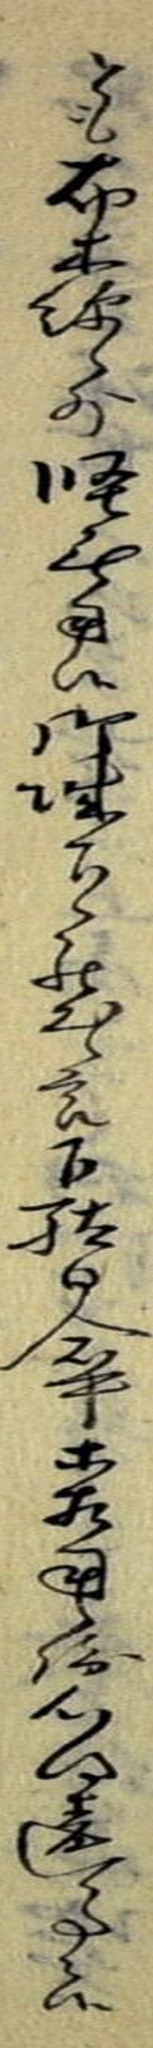とも布木綿之外堅無用候御城下へ罷出候節下駄日傘等相用候儀心得違事ニ候
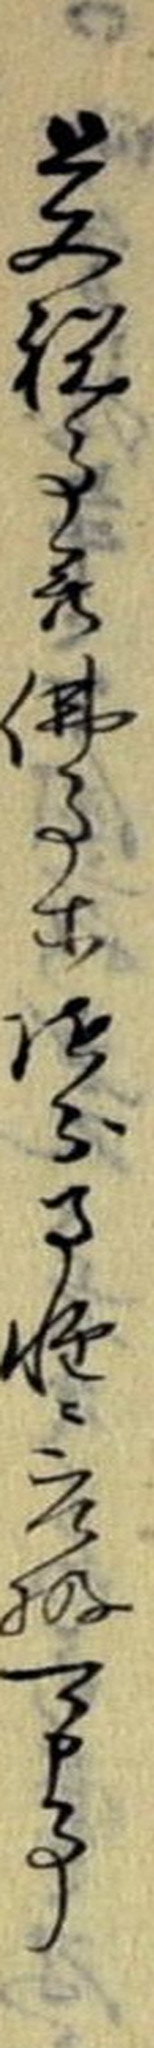且又祝事并仏事等随分事軽ニ取扱可申事
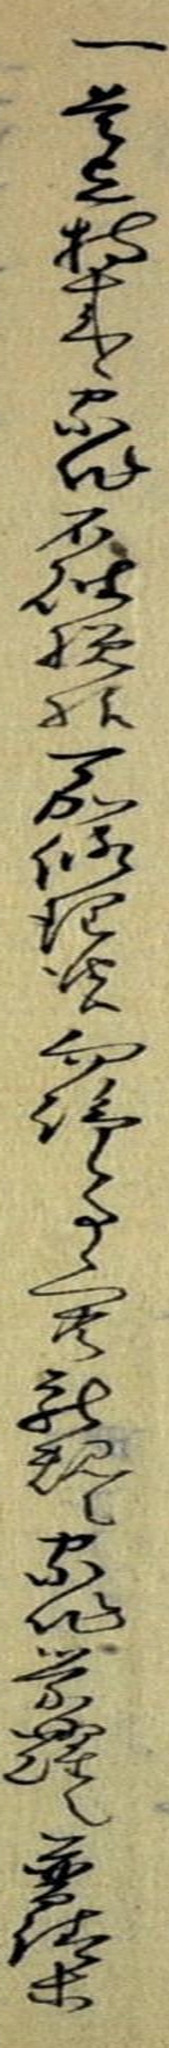一是迄持来家作不破損様可加修理儀ハ勿論之事候へ共新規之家作栄耀之普請等
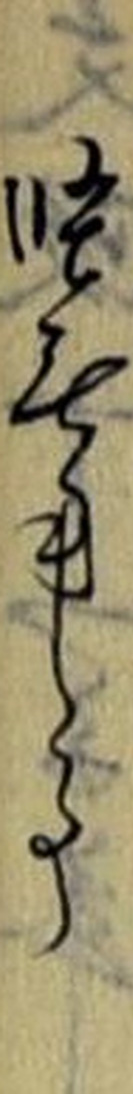堅無用之事
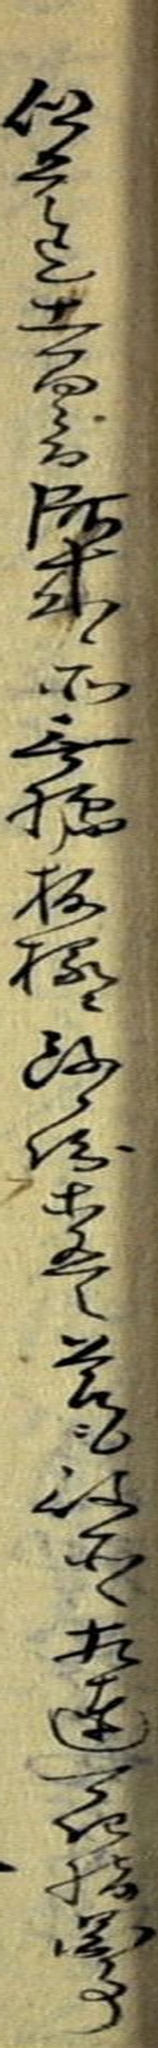但是迄土間ニ而済来候処無拠板椽ニ致候儀等有之節も役所へ相達可任指図事
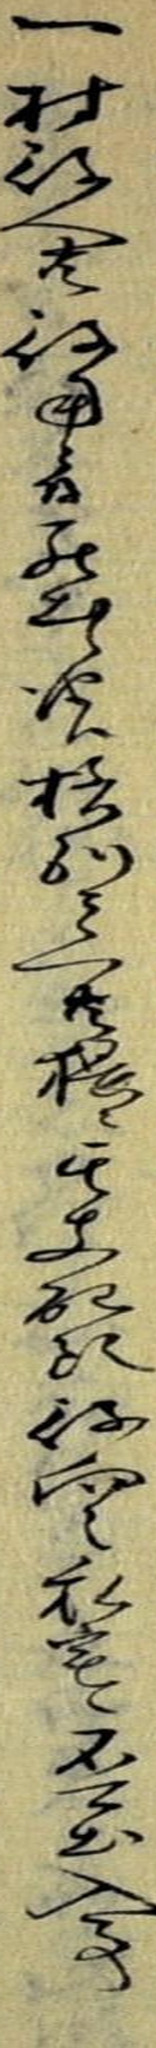一村役人共役用ニ付罷出候儀ハ格別ニ候へ共猥ニ其支配頭役向之私宅へ不可出入事
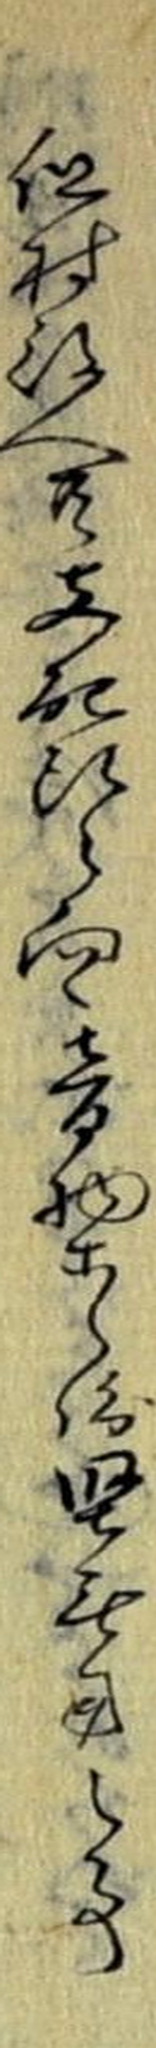但村役人共支配頭ニ向候音物等之儀堅無用之事
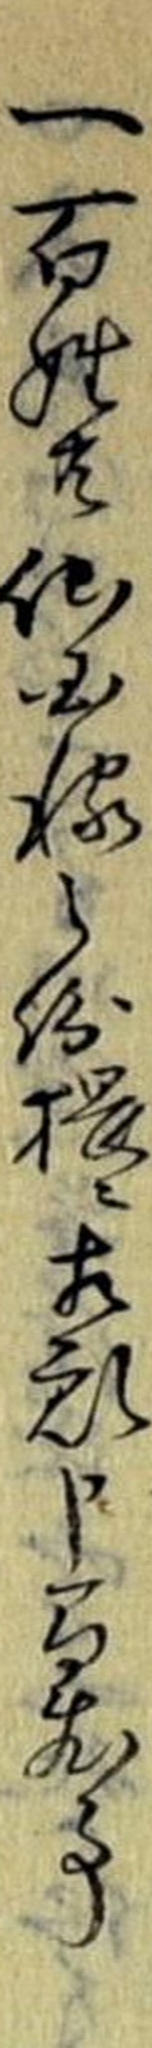一百姓共他国稼之例猥ニ相願申間敷事
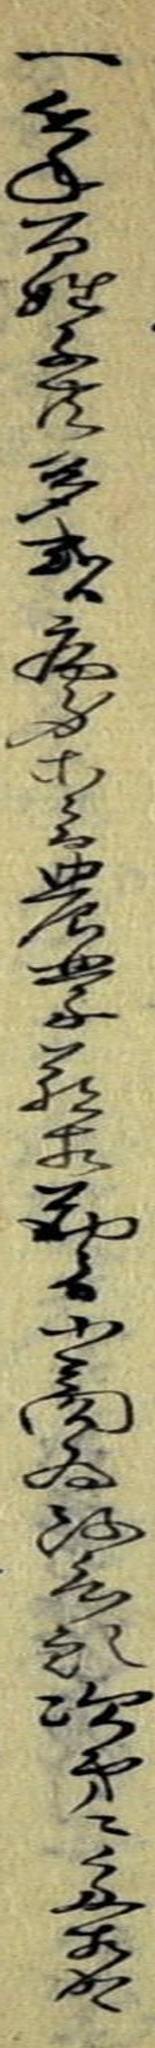一近年百姓子共多或ハ病身等ニ而農業難相勤ニ付小商為致度願次第ニ多相成候
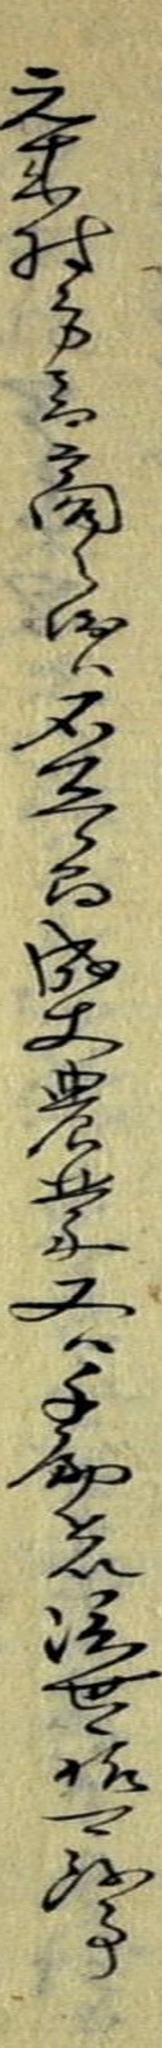元来村方ニ而商之儀ハ不宜候間成丈農業又ハ手励を以渡世候様可致事
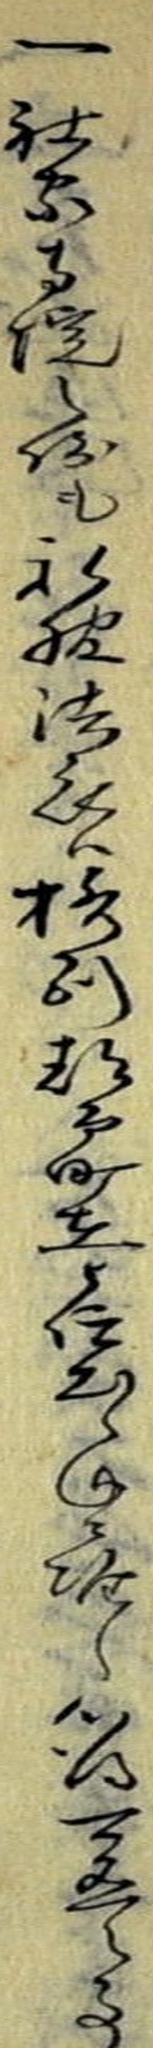一社家寺院之儀も礼服法衣ハ格別都而町在被仰出候趣ニ准し心得可有之事
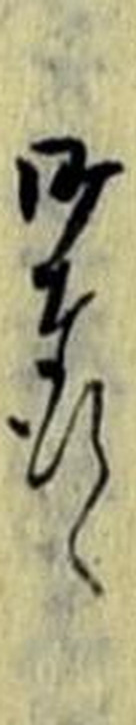町奉行へ
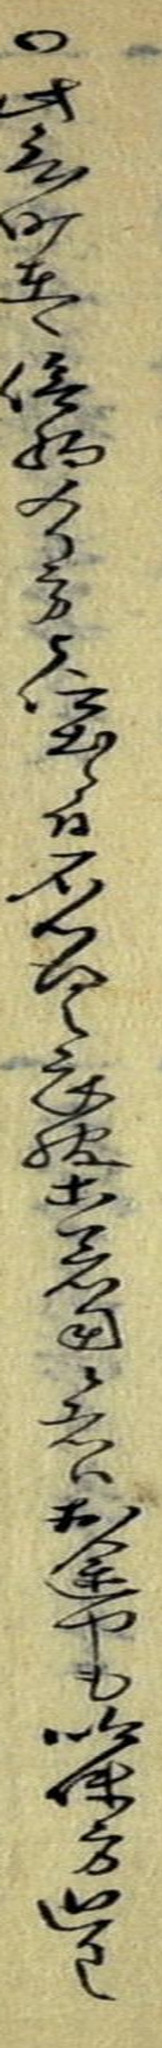○此度町在候倹約〆り方被仰出候ニ付不心得之衣服等着用之者ハ於途中も吟味方廻り之
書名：命令之部 五
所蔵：福井県文書館 Fukui Prefectural Archives
